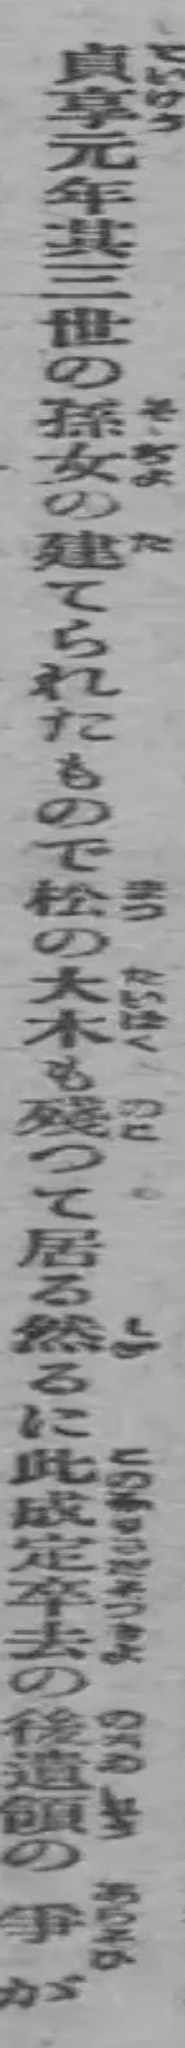貞享元年其三世の孫女の建てられたもので松の大木も残つて居る然るに此成定卒去の後遺領の争が
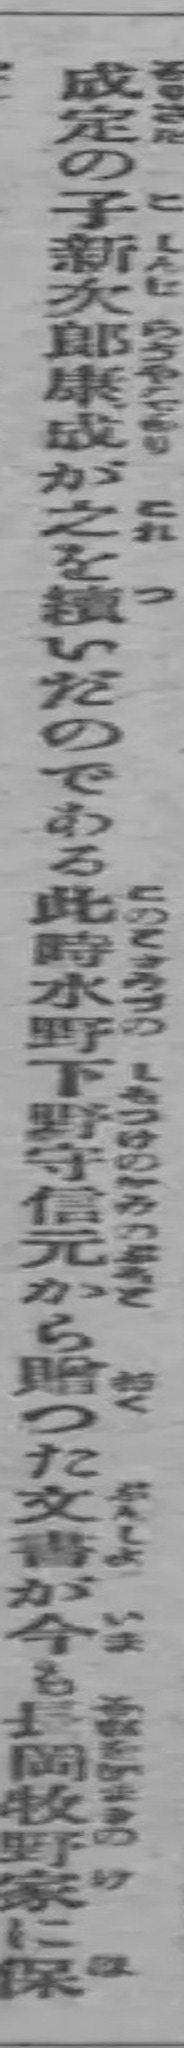成定の子新次郎康成が之を続いだのである此時水野下野守信元から贈つた文書が今も長岡牧野家に保
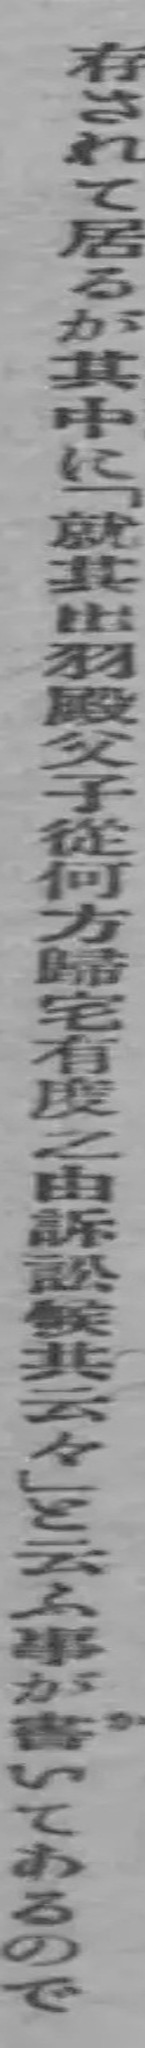存されて居るが其中に「就其出羽殿父子従何方帰宅有度之由訴訟候共云々」と云ふ事が書いてあるので

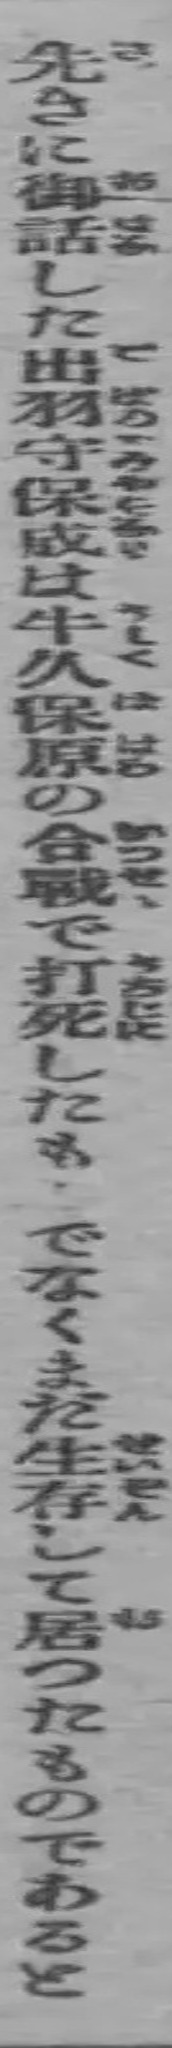先きに御話した出羽守保成は牛久保原の合戦で打死したものでなくまだ生存して居つたものであると
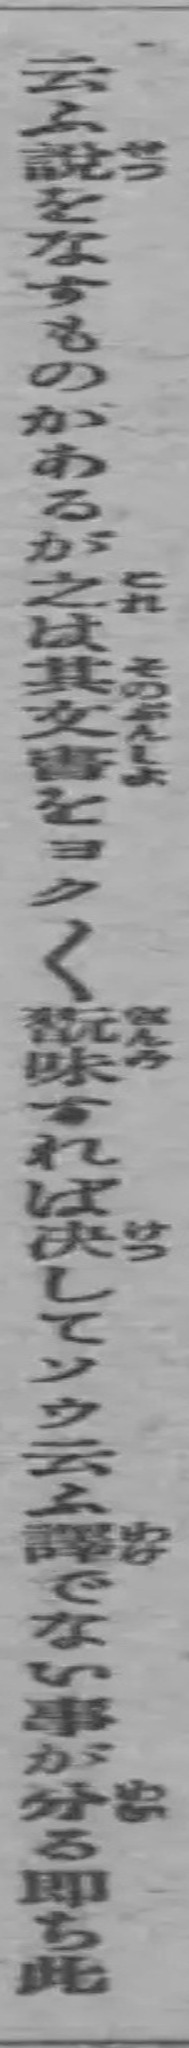云ふ説をなすものがあるが之は其文書をヨク〳〵翫味すれば決してソウ云ふ訳でない事が分る即ち此
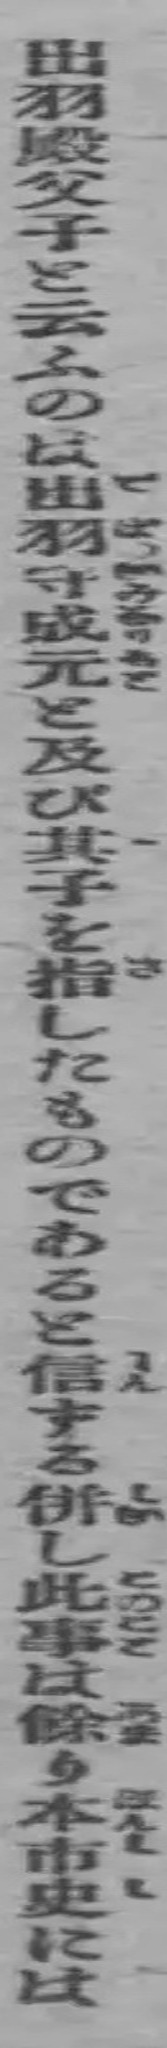出羽殿父子と云ふのは出羽守成元と及び其子を指したものであると信ずる併し此事は余り本市史には
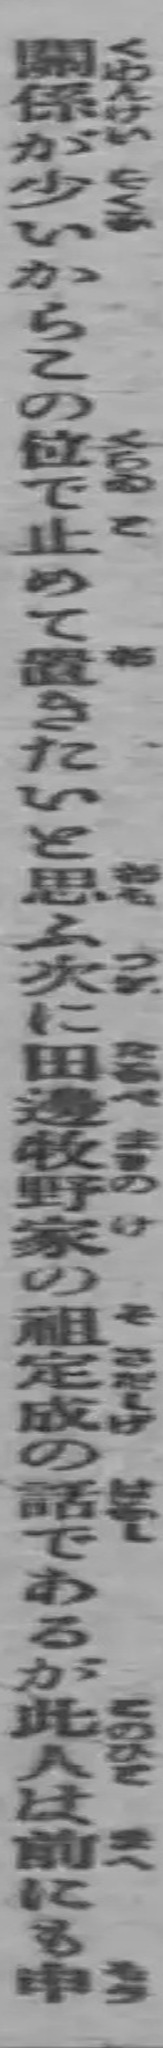関係が少いからこの位で止めて置きたいと思ふ次に田邉牧野家の祖定成の話であるが此人は前にも申
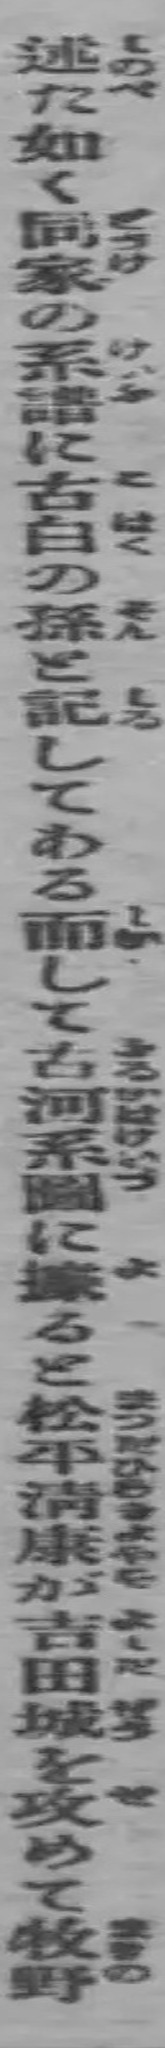述た如く同家の系譜に古白の孫と記してある而して古河系図に拠ると松平清康が吉田城を攻めて牧野
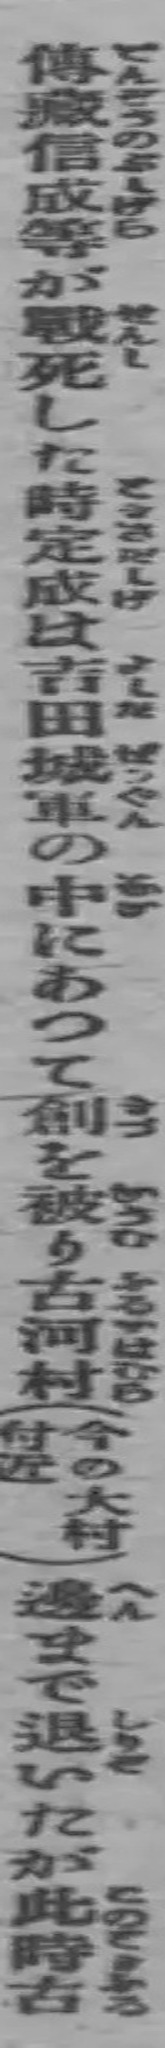傳蔵信成等が戦死した時定成は吉田城軍の中にあつて創を被り古河村(今の大村付近)辺まで退いたが此時古
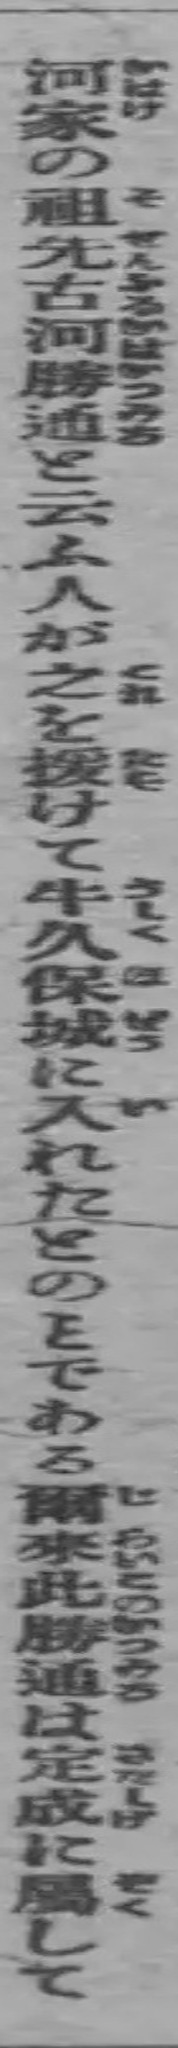河家の祖先古河勝通と云ふ人が之を援けて牛久保城に入れたとのことである爾来此勝通は定成に属して
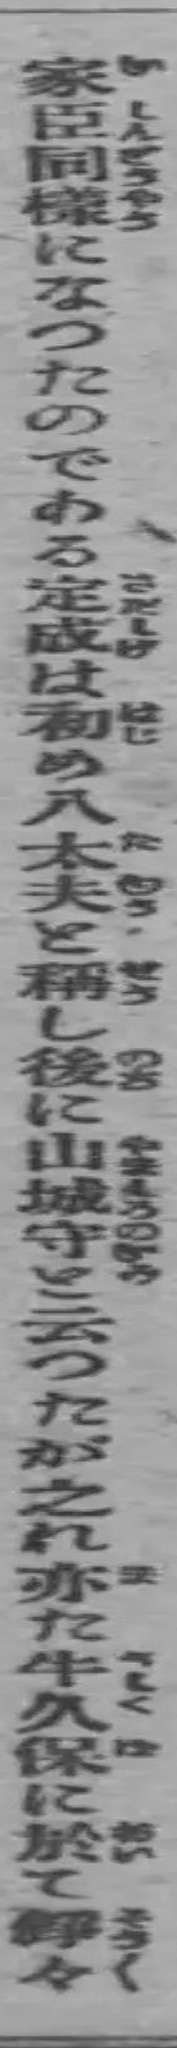家臣同様になつたのである定成は初めは八太夫と称し後に山城守と云つたが之れ亦た牛久保に於て錚々
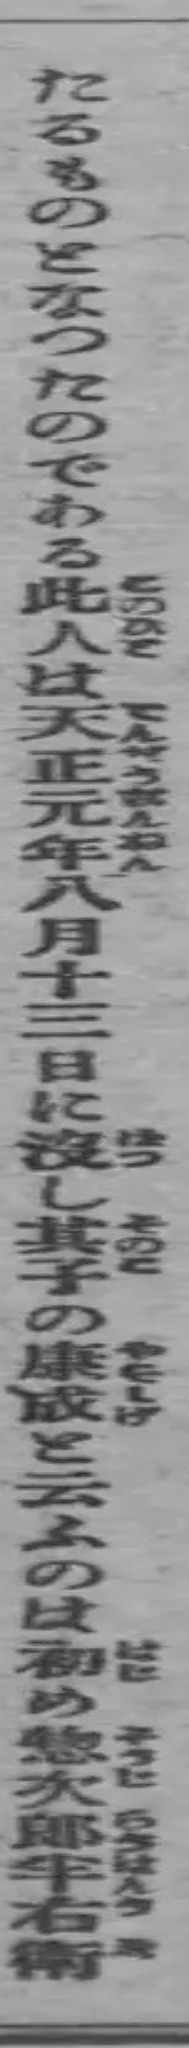牧野惣次郎康成たるものとなつたのである此人は天正元年八月十三日に没し其子の康成と云ふのは初め惣次郎半右衛
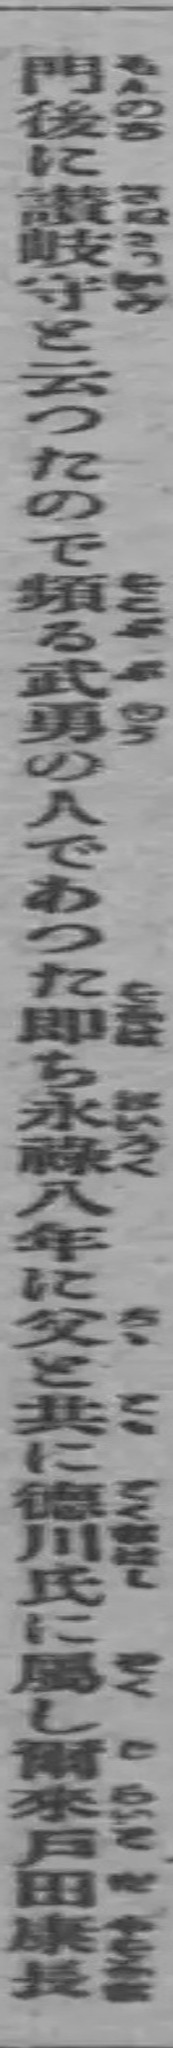門後に讃岐守と云つたので頗る武勇の人であつた即ち永禄八年に父と共に徳川氏に属し爾来戸田康長
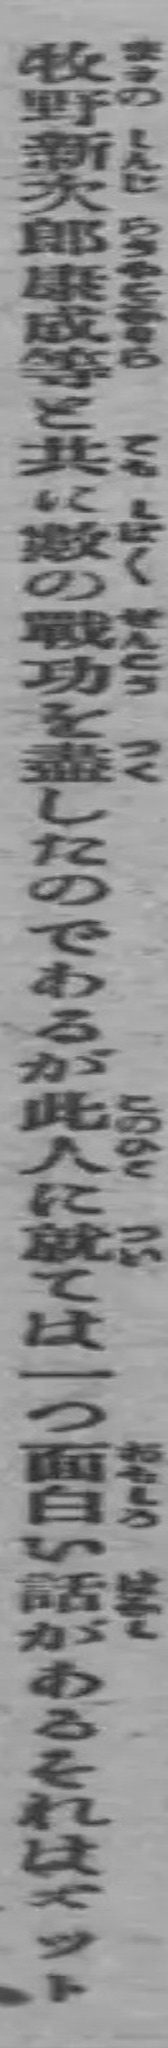過銭の茶壺牧野新次郎康成等と共に数の戦功を尽したのであるが此人に就ては一つ面白い話があるそれはズツト
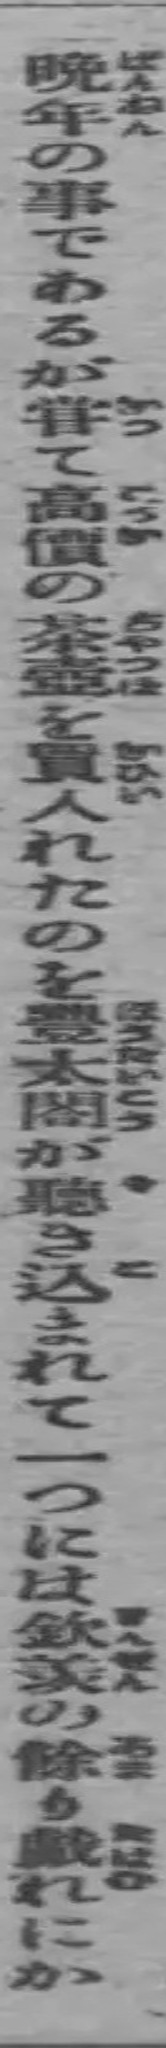晩年の事であるが嘗て高価の茶壷を買入れたのを豊太閤が聴き込まれて一つには欽羨の余り戯れにか
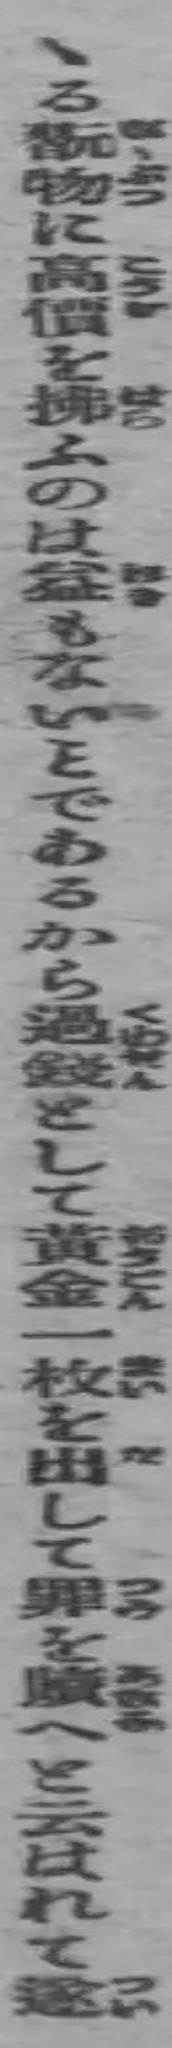ゝる翫物に高価を払ふのは益もないことであるから過銭として黄金一枚を出して罪を贖へと云はれて遂
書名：豊橋市史談
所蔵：国立国会図書館 National Diet Library, JAPAN
